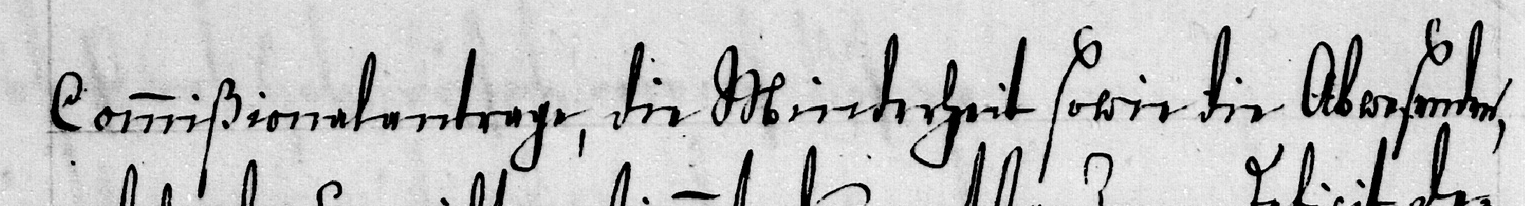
Commißionalantrage, die Minderheit sowie die Abwesende¬
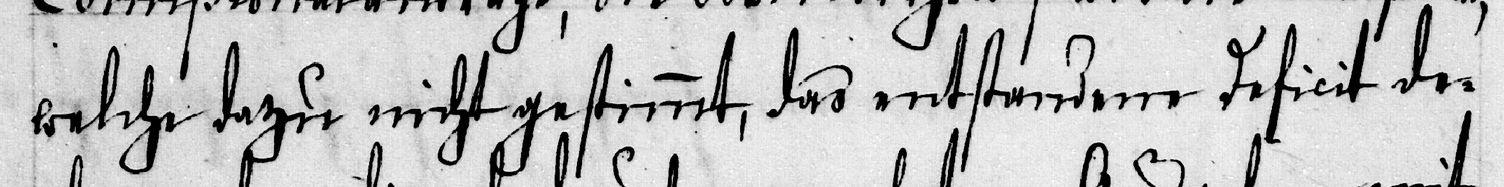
welche dazu nicht gestimmt, das entstandene Deficit de¬
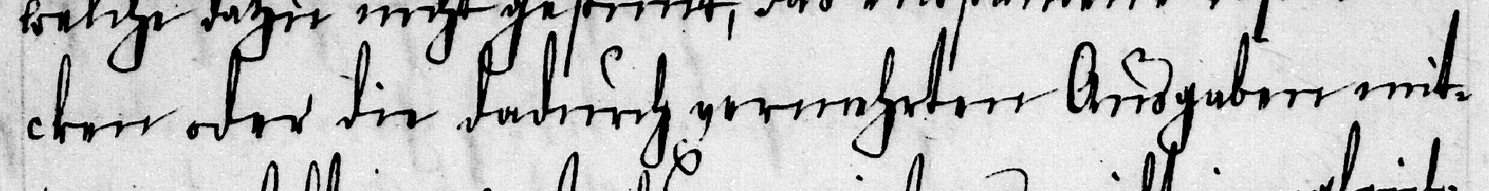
cken oder die dadurch vermehrten Ausgaben mit¬
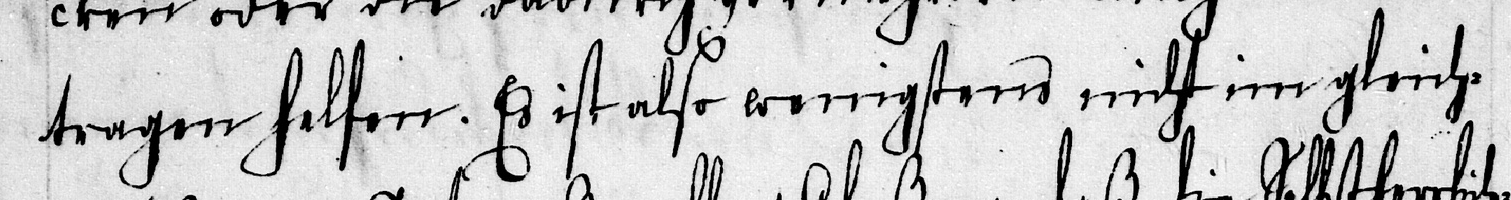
tragen helfen. Es ist also wenigstens nicht im gleich¬
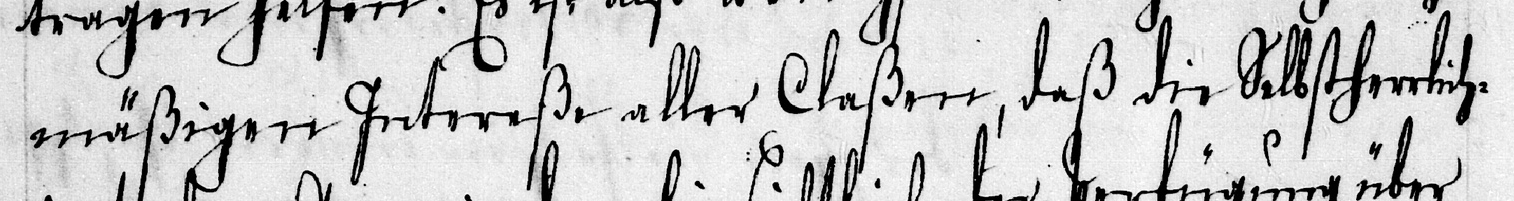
mäßigen Intereße aller Claßen, daß die Selbstherrli¬
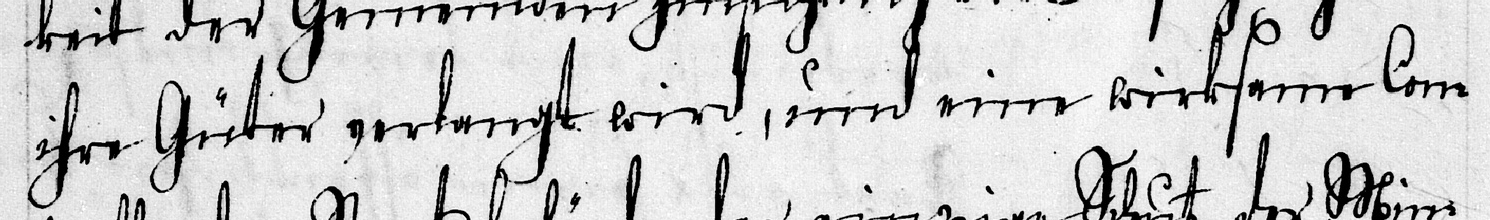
ihre Güter verlangt wird, und eine wirksame Con¬
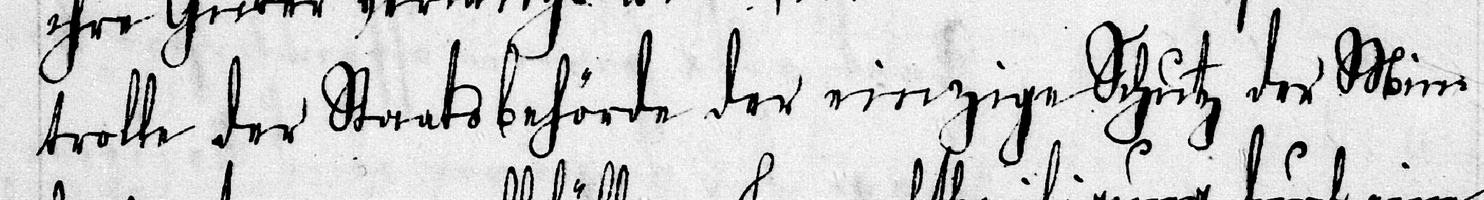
trolle der Staatsbehörde der einzige Schutz der Min¬
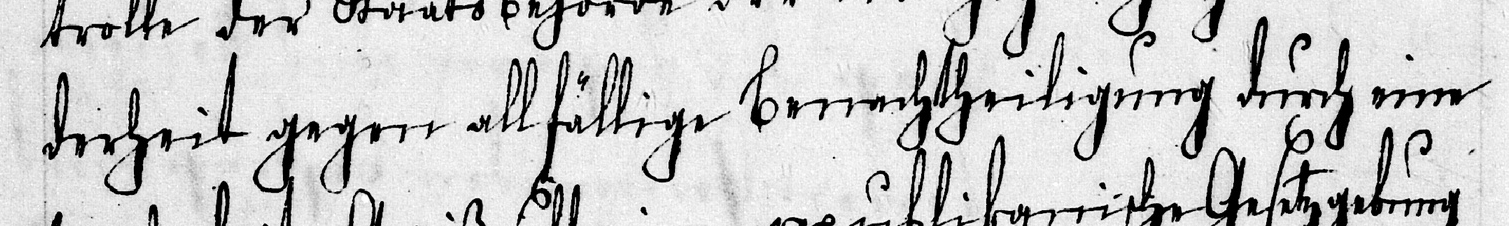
derheit gegen allfällige Benachtheiligung durch eine
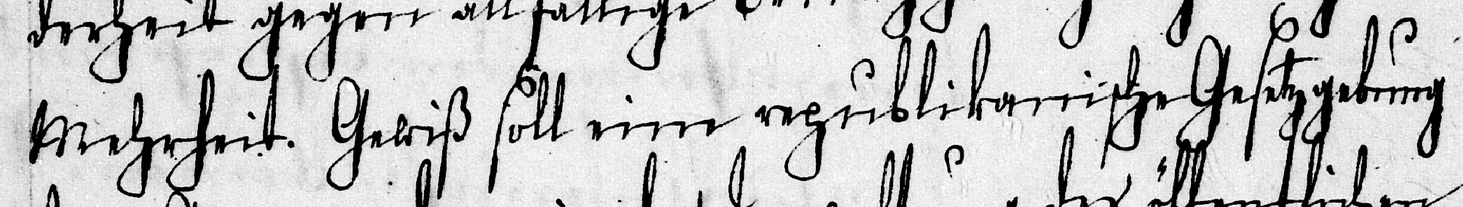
Mehrheit. Gewiß soll eine republikanische Gesetzgebung
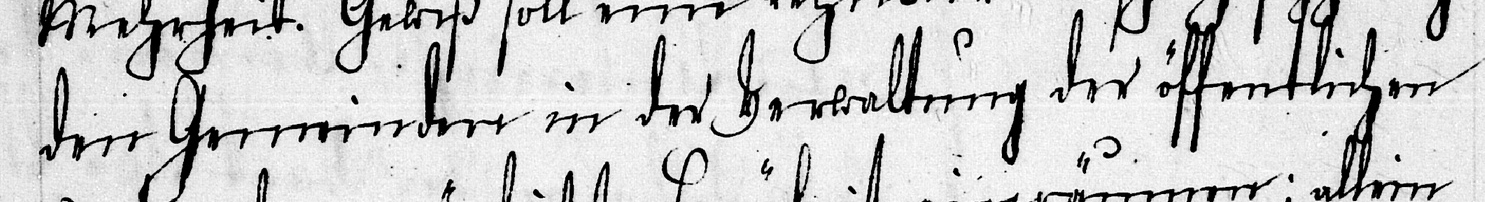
den Gemeinden in der Verwaltung der öffentlichen
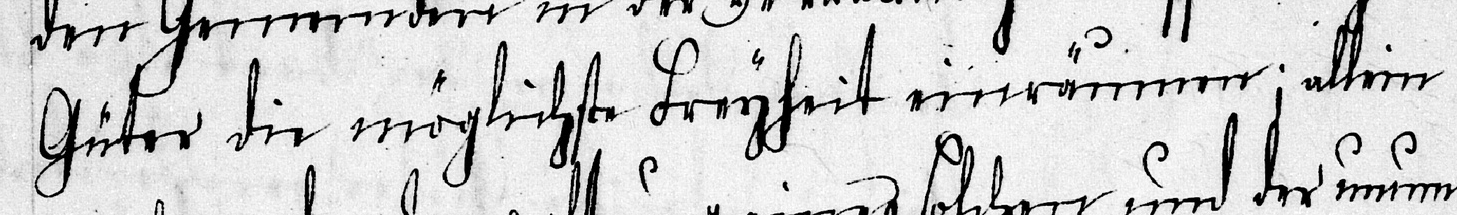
Güter die möglichste Freyheit einräumen; allein
